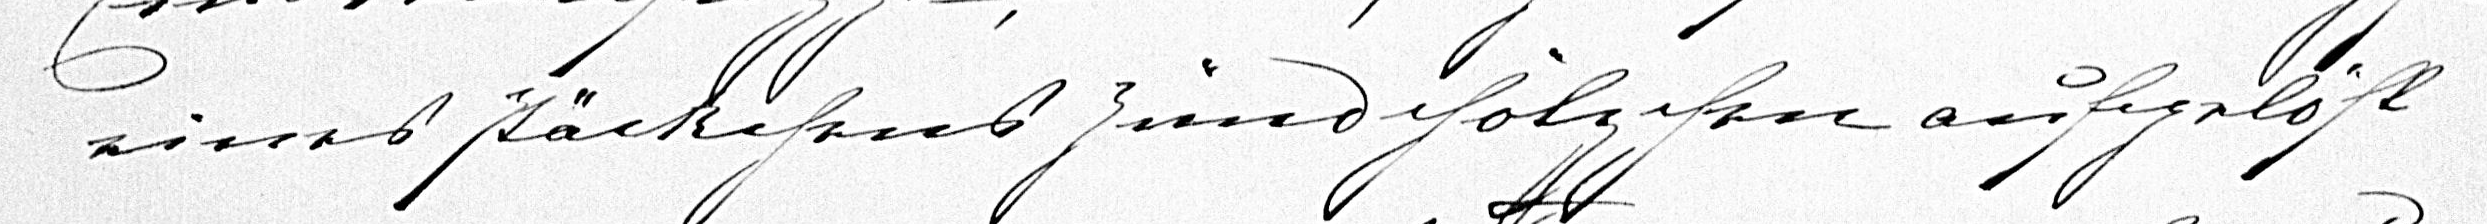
eines stöckchens Zündholzchen aufgelöst
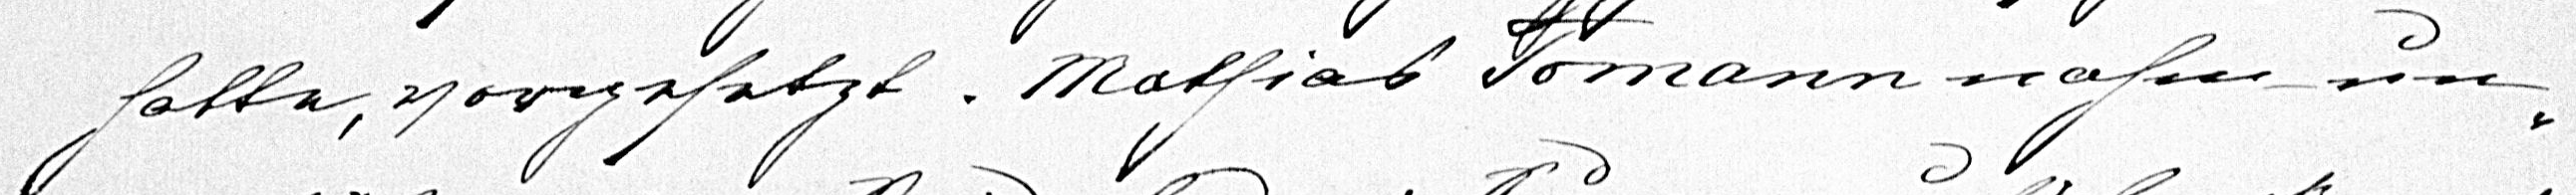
hatte, vorgesetzt. Mathias Tomann nahm_un¬
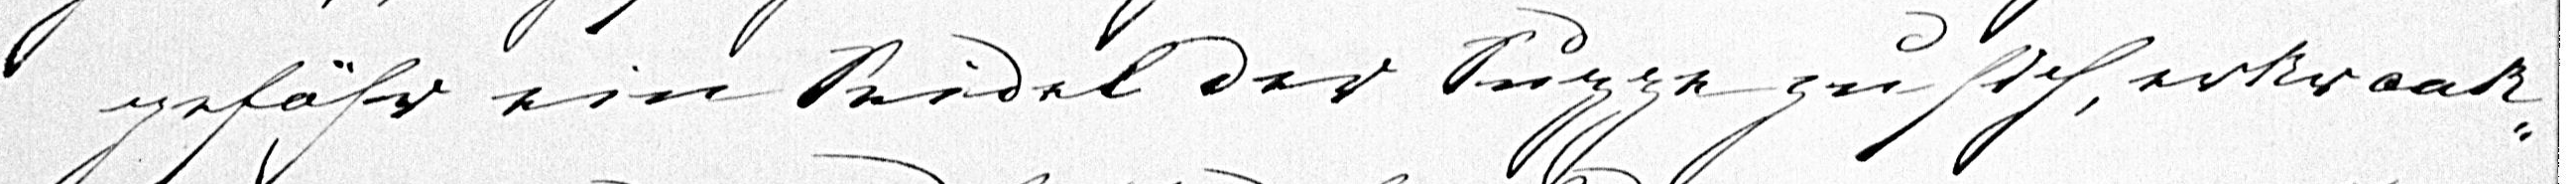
gefähr ein Seidel der Suppe zu sich, erkrank¬
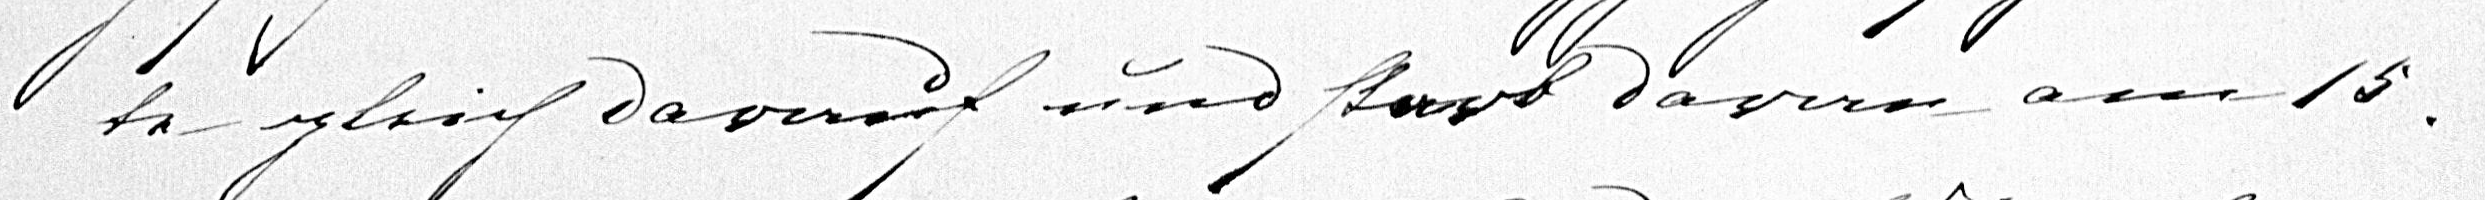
te gleich darauf und starb daran am 15.
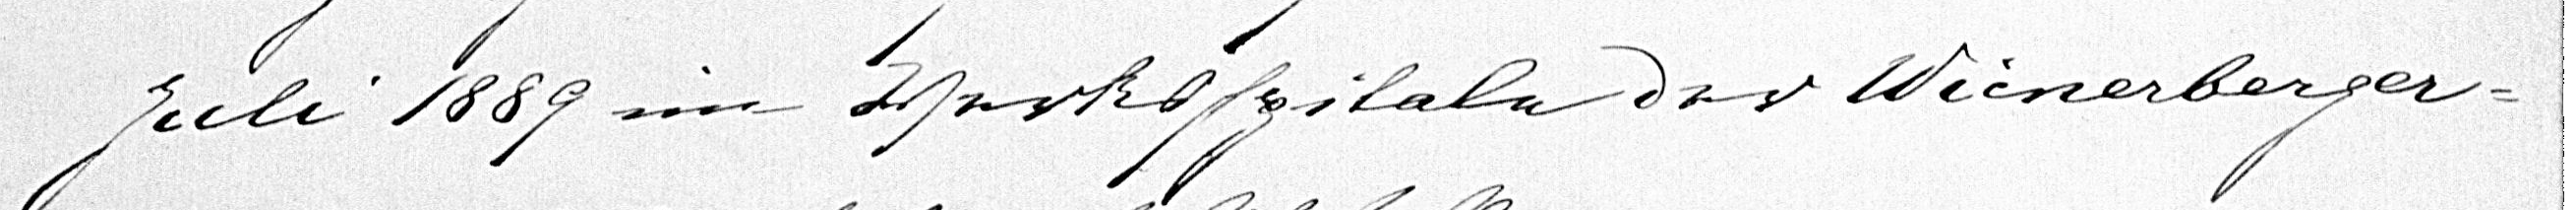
Juli 1889 im Verksspitale der Wienerberger¬
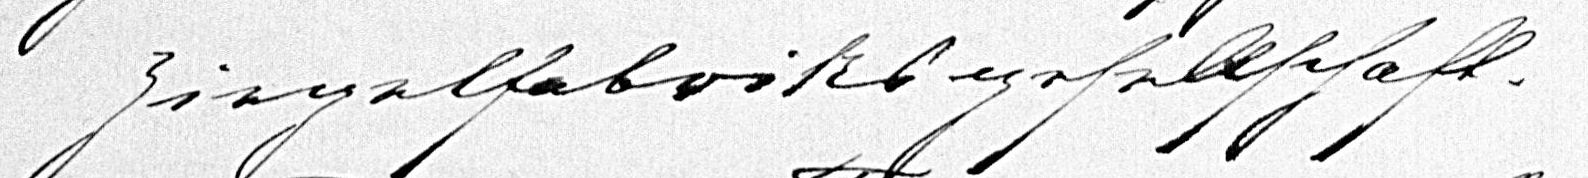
Ziegelfabriksgesellschaft.
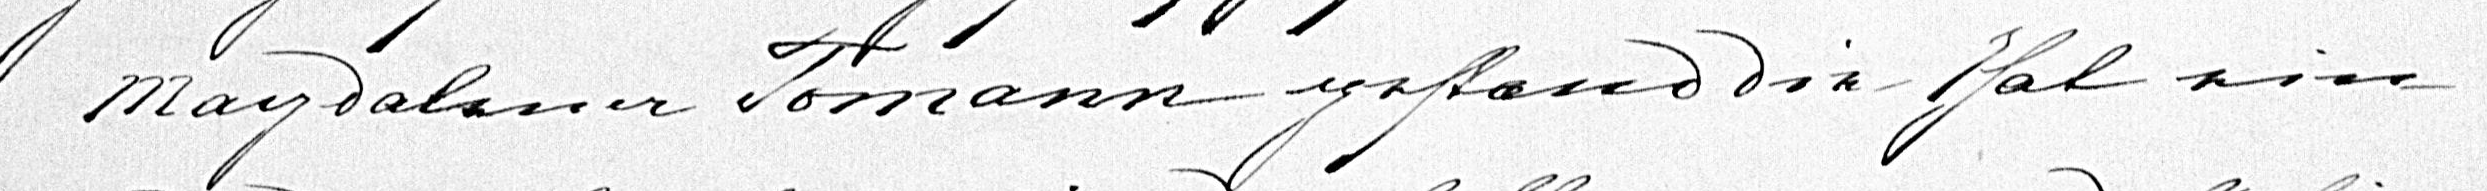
Magdalena Tomann gestand die That ein
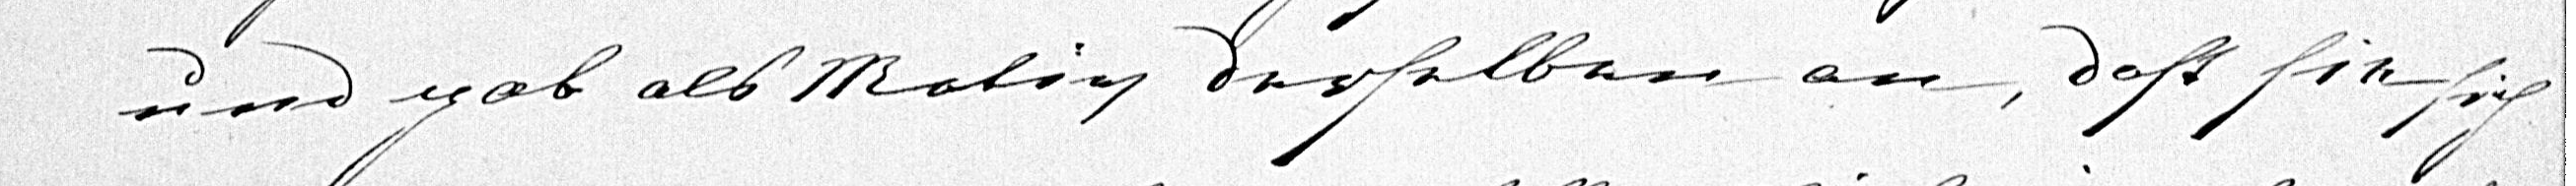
und gab als Motiv derselben an, daß sie sich
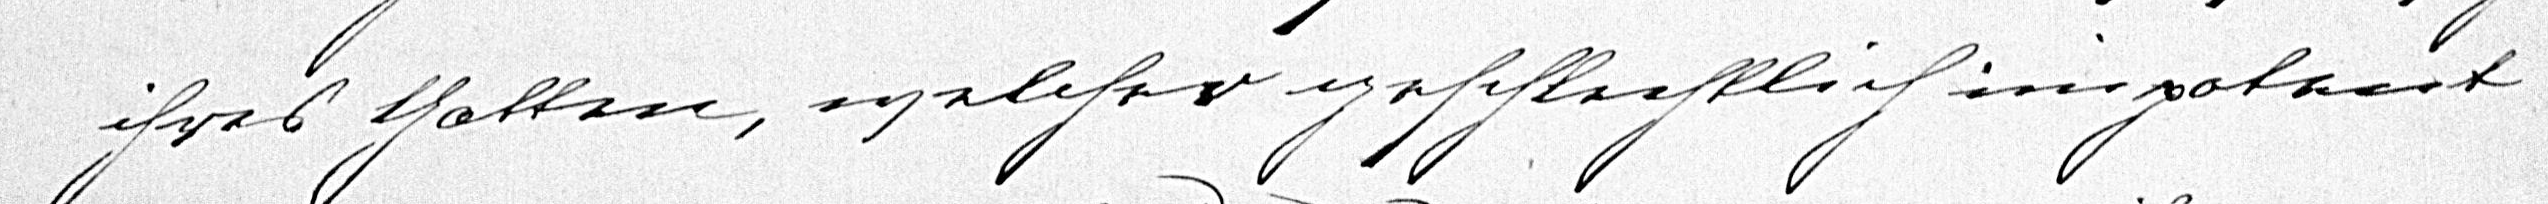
ihres Gatten, welcher geschlechtlich impotent
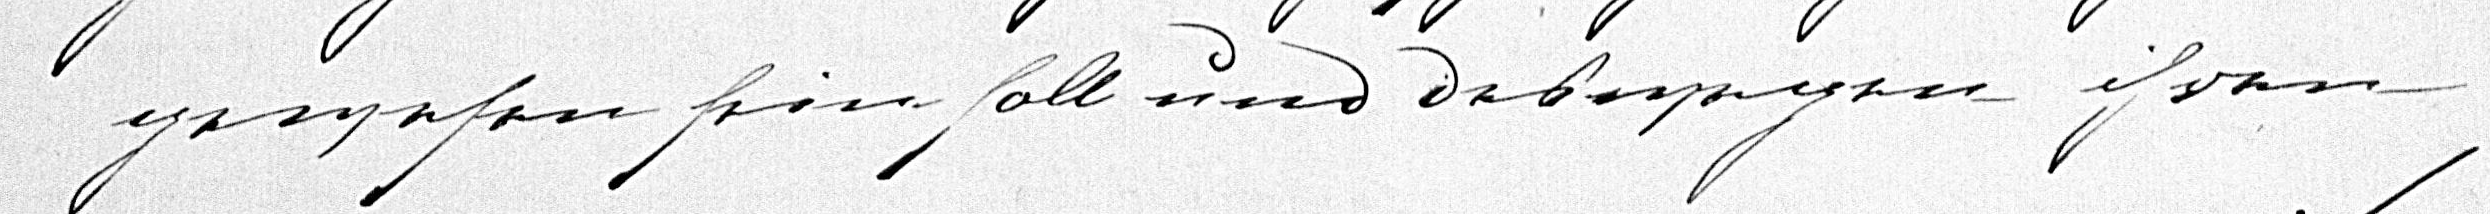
gewesen sein soll und deswegen ihren
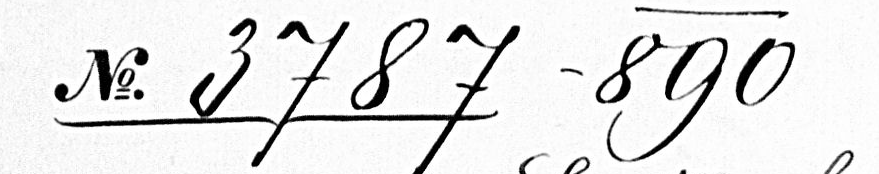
N° 3787-890
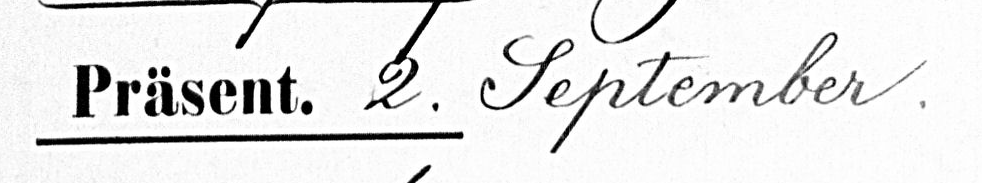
Präsent. 2. September.
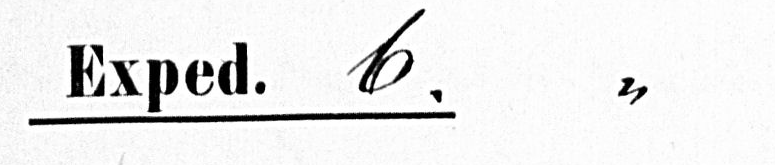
Exped. 6. September.
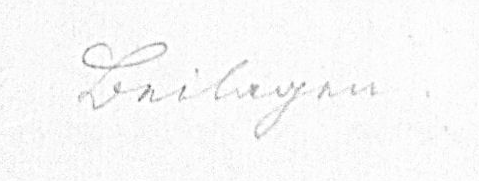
Beilagen
